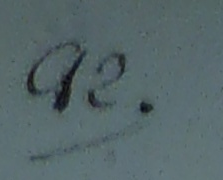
92.
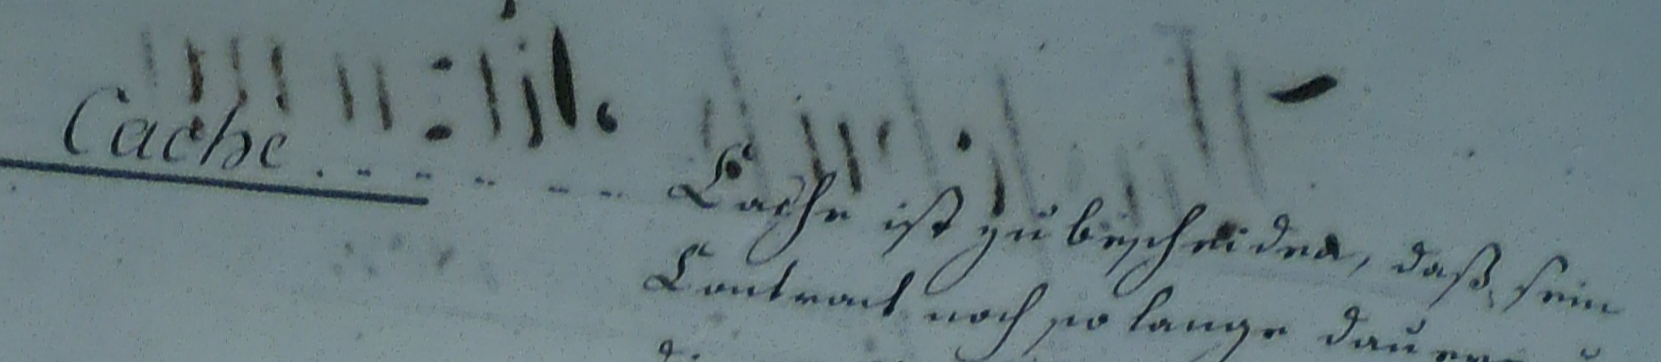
Cache. .. .. .. .. .. Cache ist zu bescheiden, daß sein
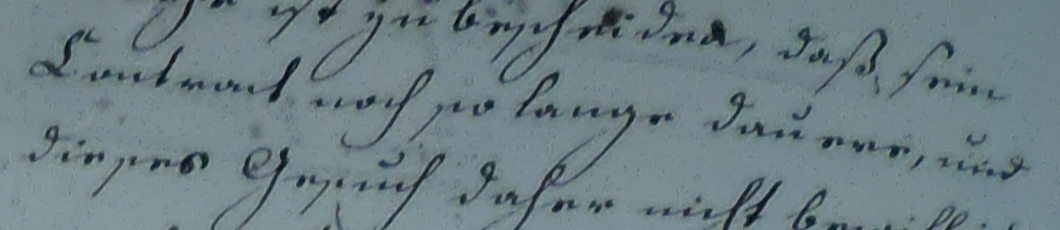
Contract noch so lange dauere, und
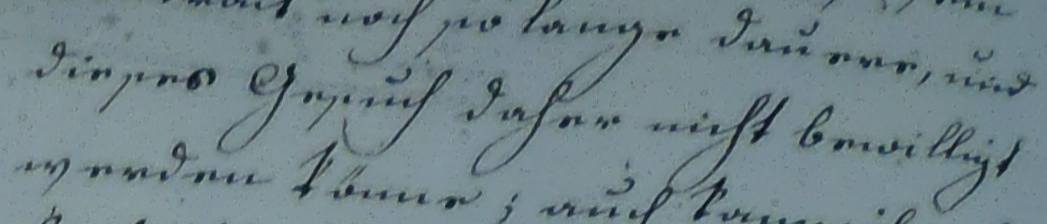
dieses Gesuch daher nicht bewilligt
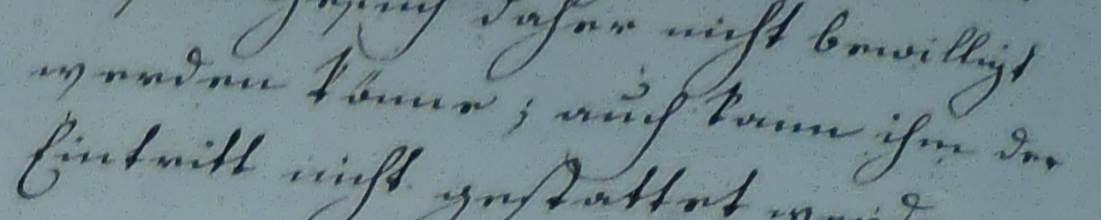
werden könne; auch kann ihm der
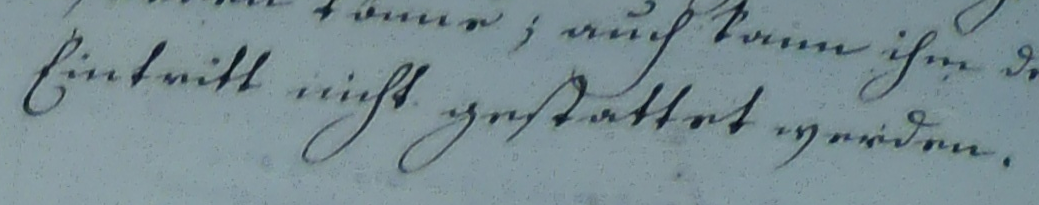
Eintritt nicht gestattet werden.
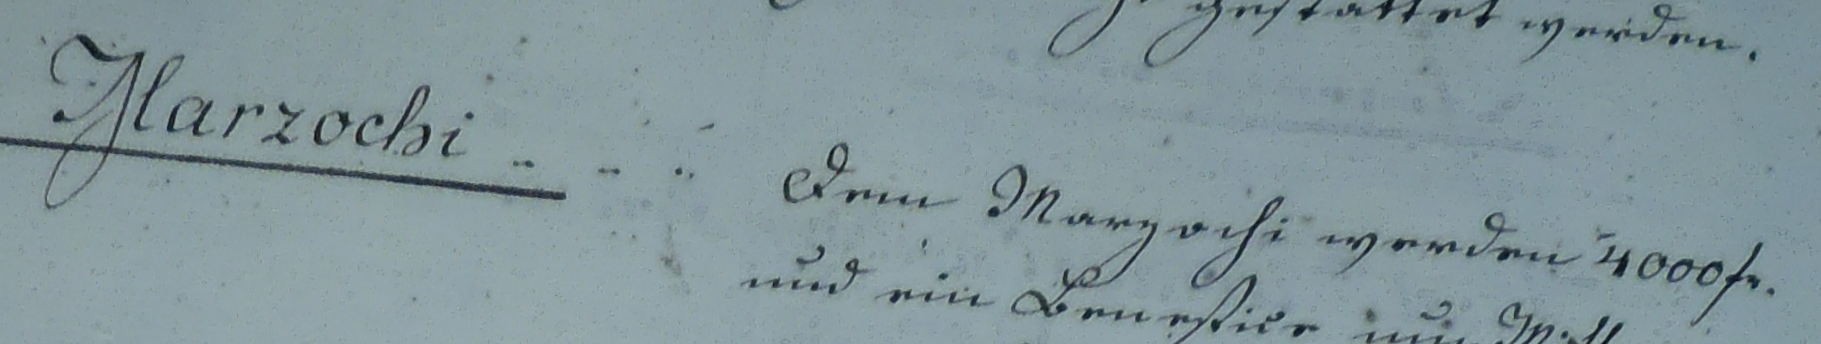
Marzochi. .. .. .. Dem Marzochi werden 4000fr.
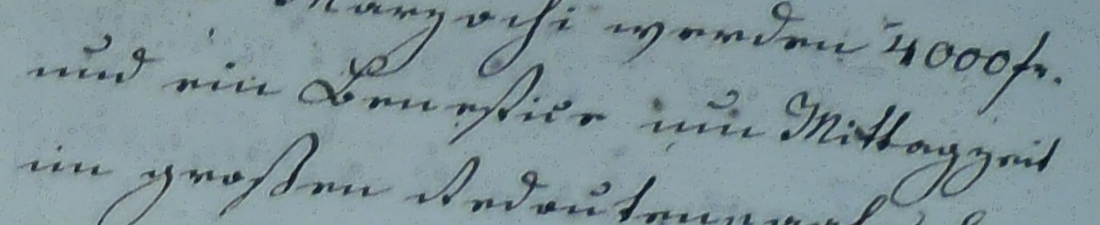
und ein Benefice um Mittagzeit
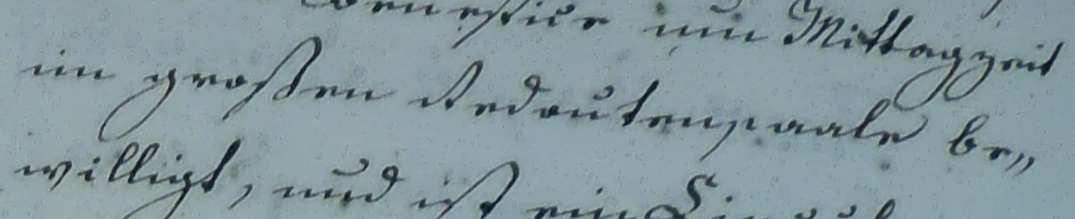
im großen Redoutensaale be¬
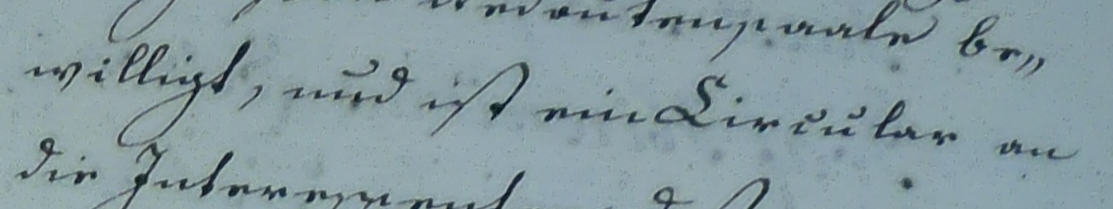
willigt, und ist ein Circular an
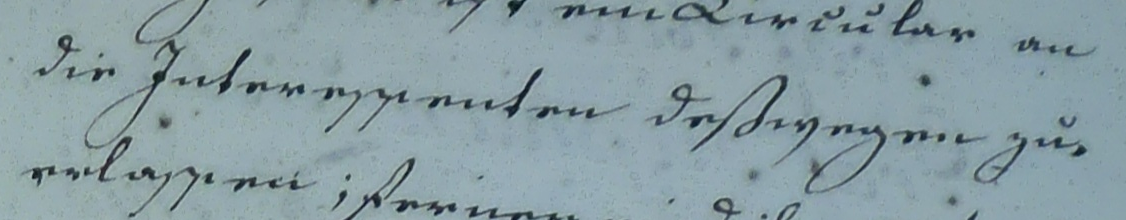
die Interessenten deßwegen zu¬
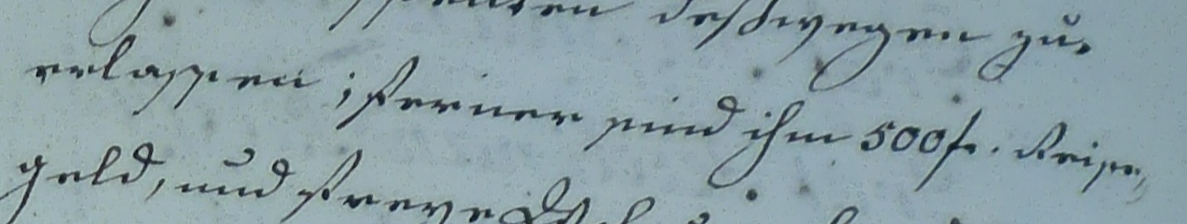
erlassen; ferner sind ihm 500fr. Reise¬
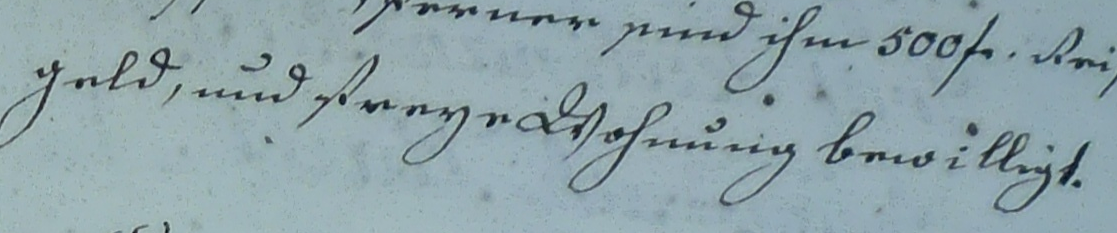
geld, und freye Wohnung bewilligt.
